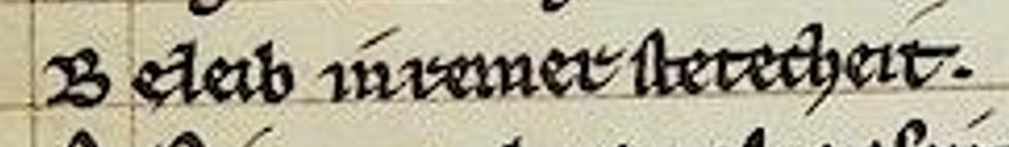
Beleib in reiner ſtetecheit.
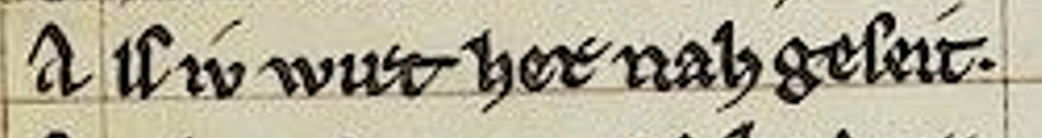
Alſ iv wirt her nah geſeit.
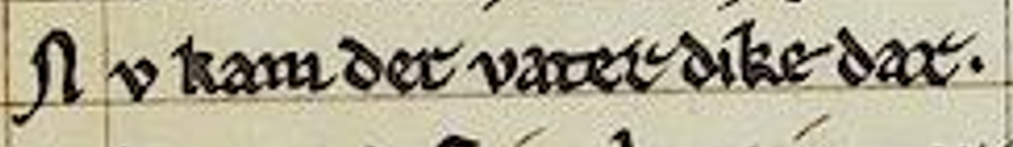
Nv kam der vater dike dar.
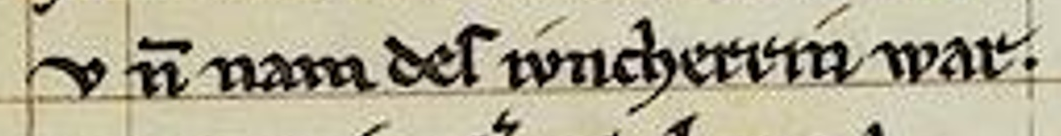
Vn(d) nam deſ ivncherrin war.
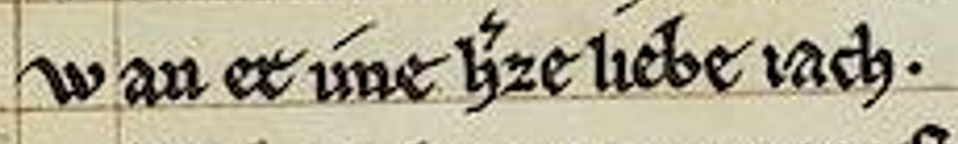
Wan er ime h(er)ze liebe iach.
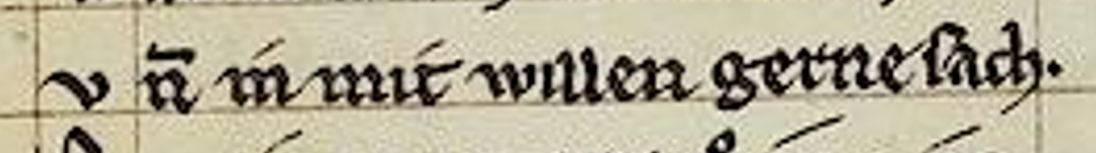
Vn(d) in mit willen gerne ſach.
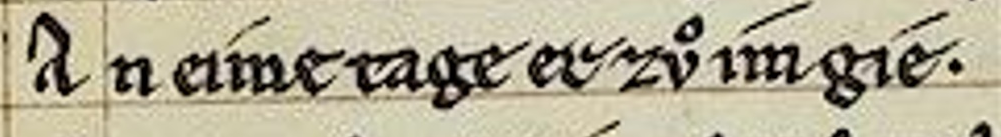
An eime tage er zv°o im gie.
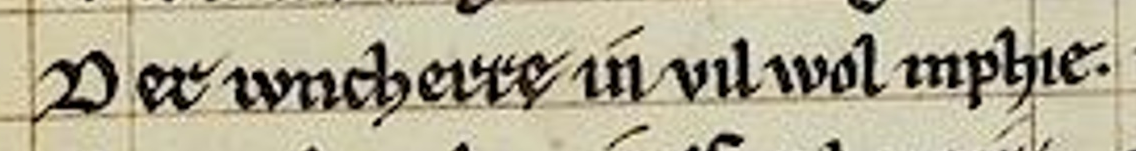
Der ivncherre in vil wol imphie.
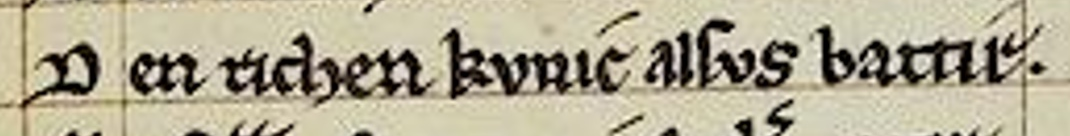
Den richen kvnic alſus battir.
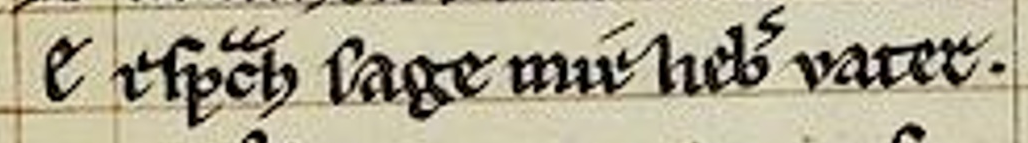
Erſp(ra)ch ſage mir lieb(er) vater.
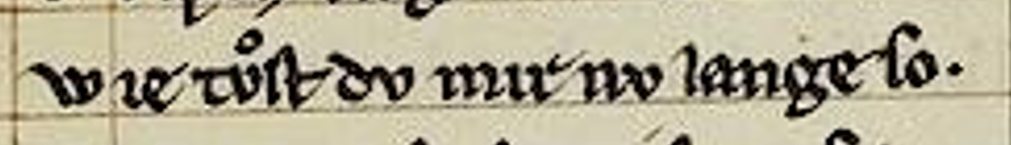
Wie tv°oſt dv mir nv lange ſo.
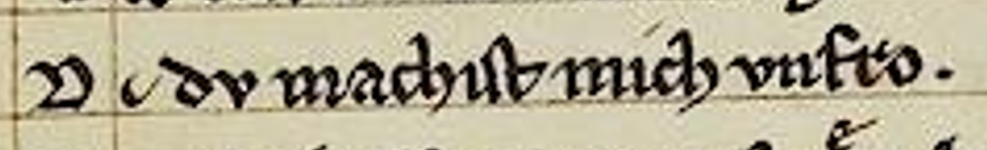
D(az) dv machiſt mich vnfro.
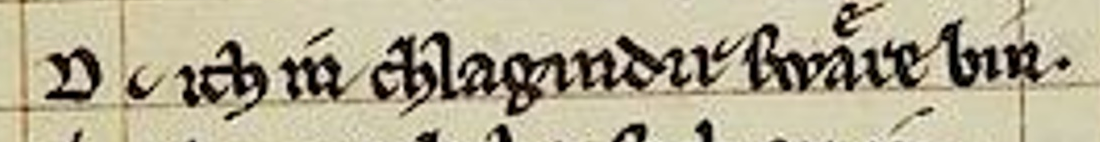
D(az) ich in chlagindir ſwa°ere bin.
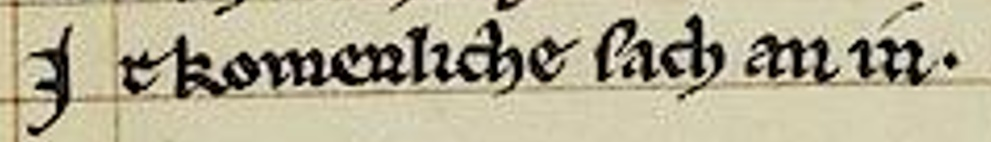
Irkomenliche ſach an in.
